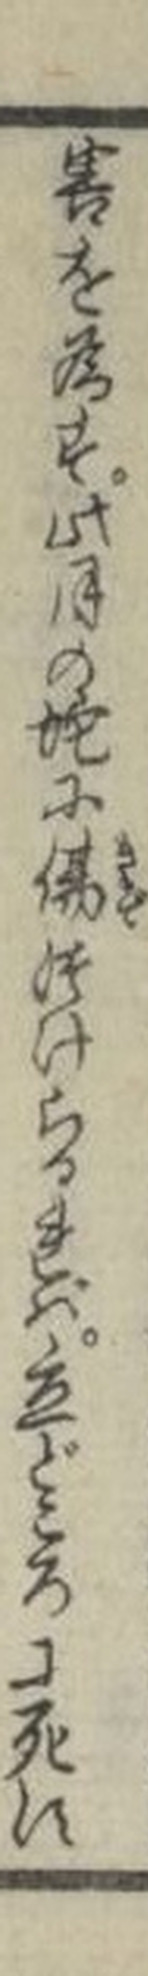害を為す。此月の蛇に傷つけらるれば。立どころに死す
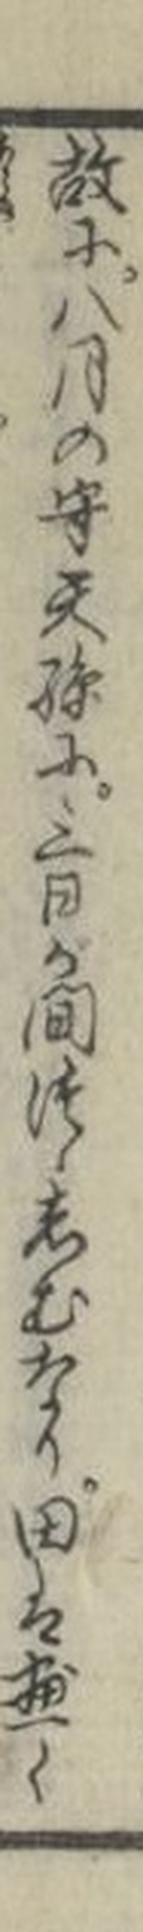故に。八月の守天孫に。三日が間つゝしむなり。田は惣く

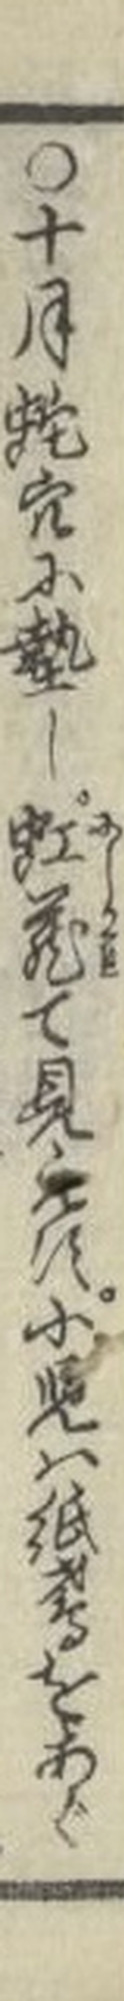○十月蛇穴に墊し。虹蔵て見えす。小児は紙鳶をあぐ
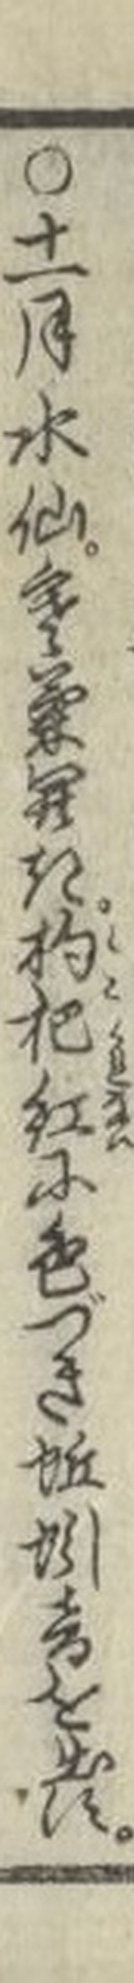○十一月水仙。寒菊開き。杓杷紅に色づき蚯蚓音を出す。
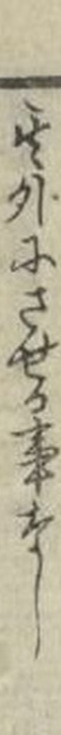其外にさせる事なし
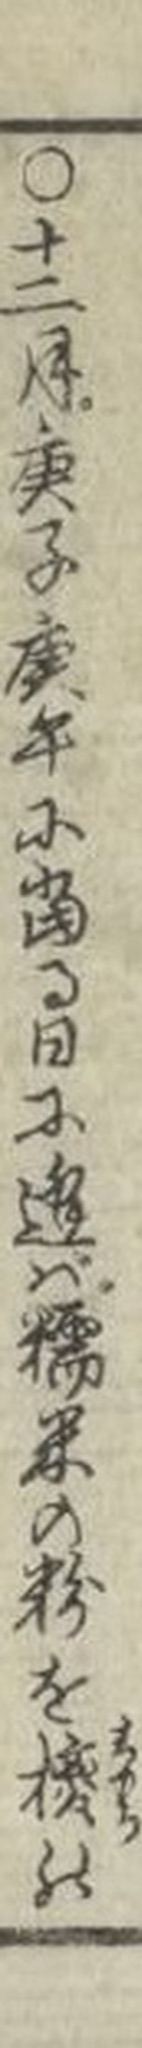○十二月。庚子庚午に当る日に逢ば。糯米の粉を椶の
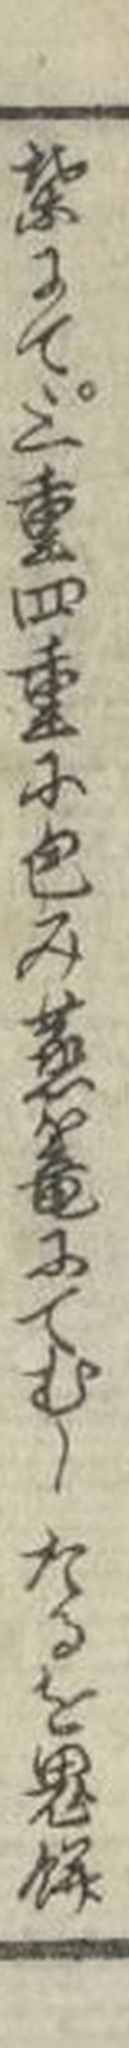葉にて。三重四重に包み蒸篭にてむしたるを鬼餅
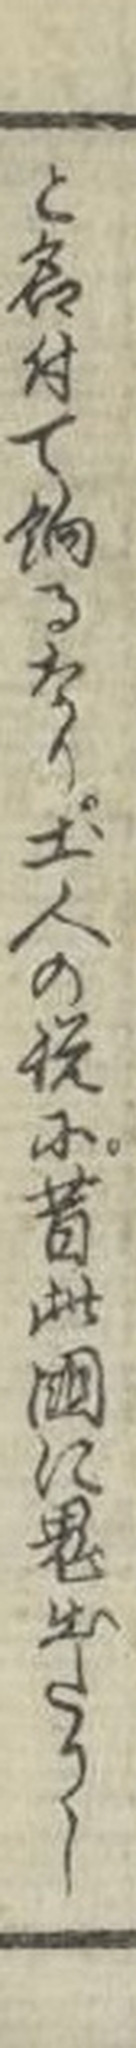と名付て餉るなり。土人の説に。昔此国に鬼出たりし
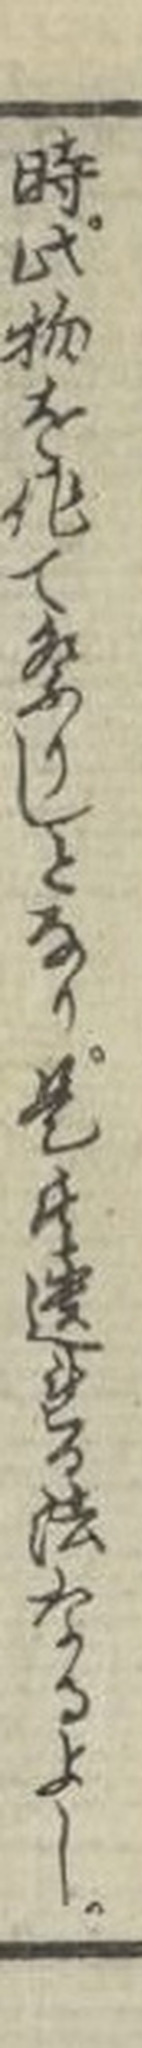時。此物を作て祭りしとなり。是其遺れる法なるよし。
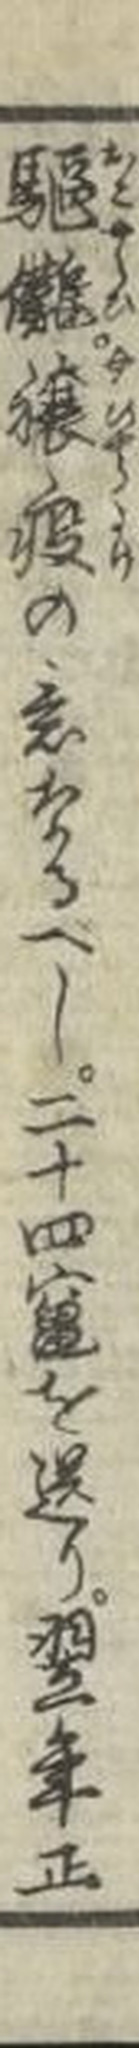駆儺。禳疫の意なるへし。二十四竈を送り。翌年正
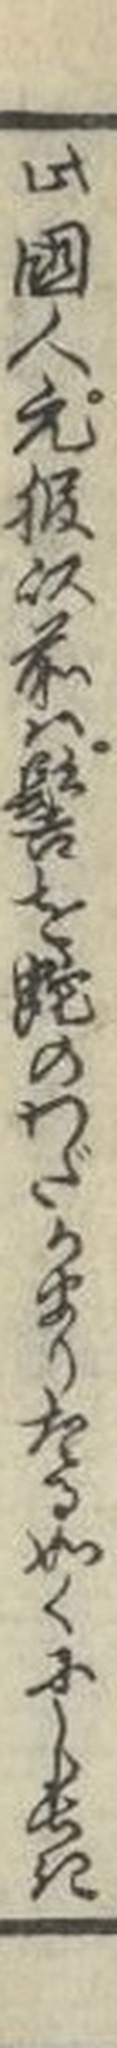此国人。元服以前は髻を蛇のわだかまりたる如くにし長き
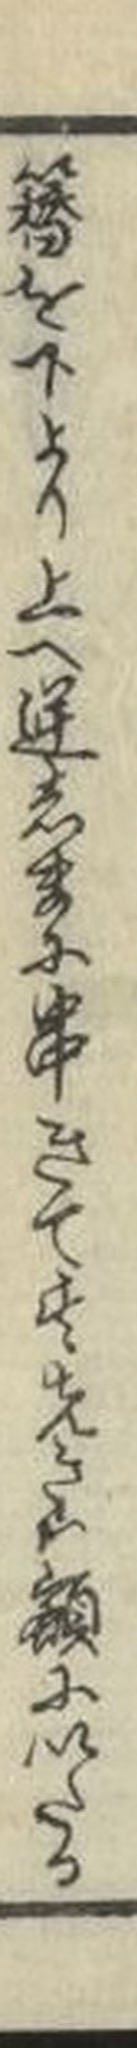簪を下より上へ逆しまに串きて其先きは額にいたる
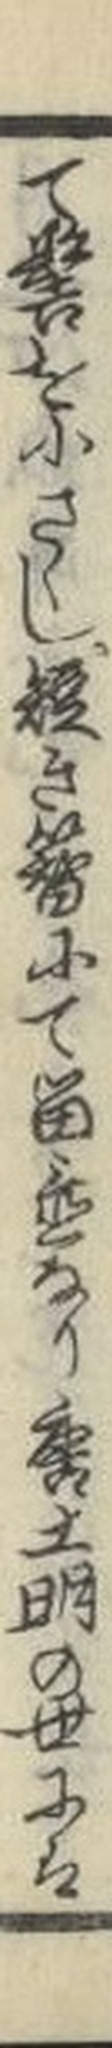て髻を小さくし。短き簪にて留置なり唐土明の世には
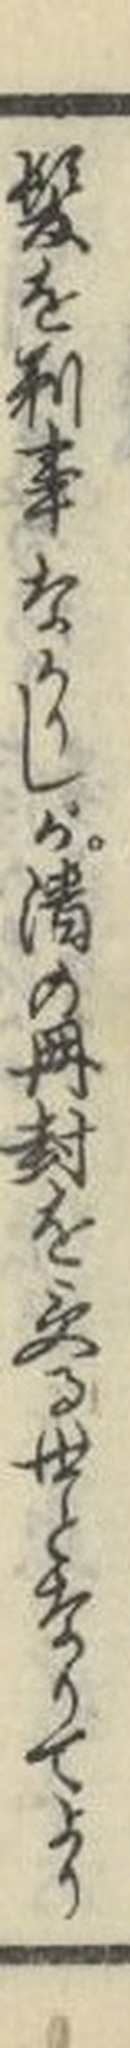髪を剃事なかりしが。清の冊封を受る世となりてより
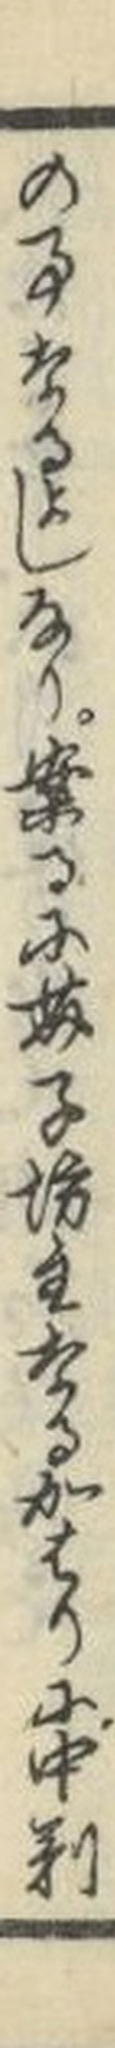の事なるよしなり。案るに芴子坊主なるかはりに。中剃
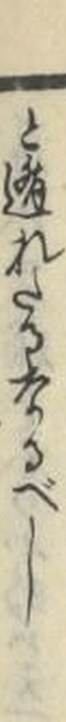と遁れたるなるべし
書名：琉球解語
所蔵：University of the Ryukyus Library
